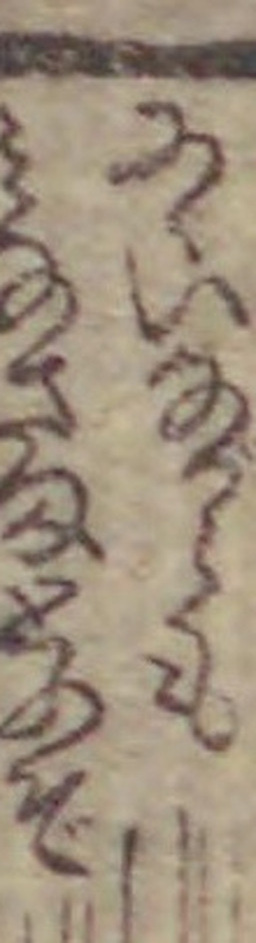みなさまとふぞ
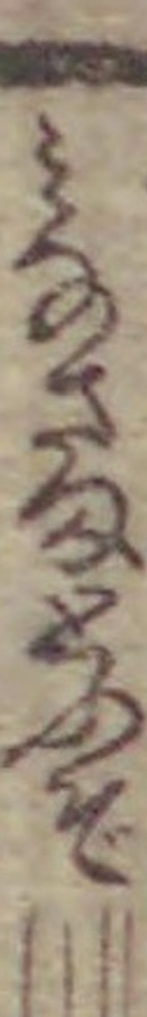みなさまとふぞ
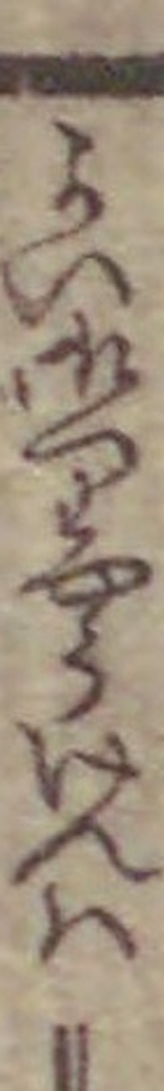よい御りやうけんは
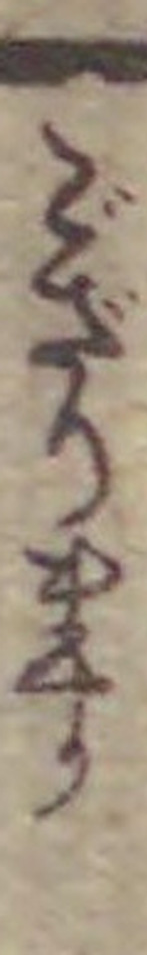ござります
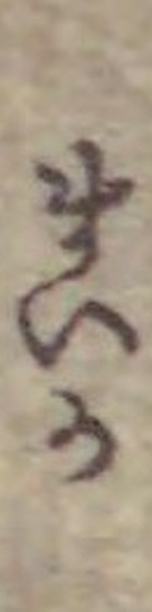まいか

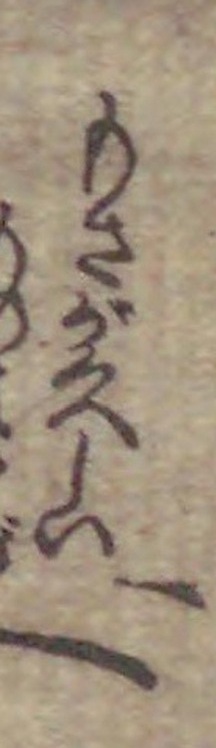もさが久しい
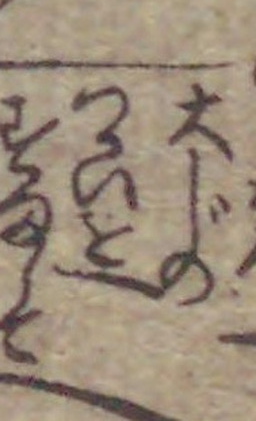すまして
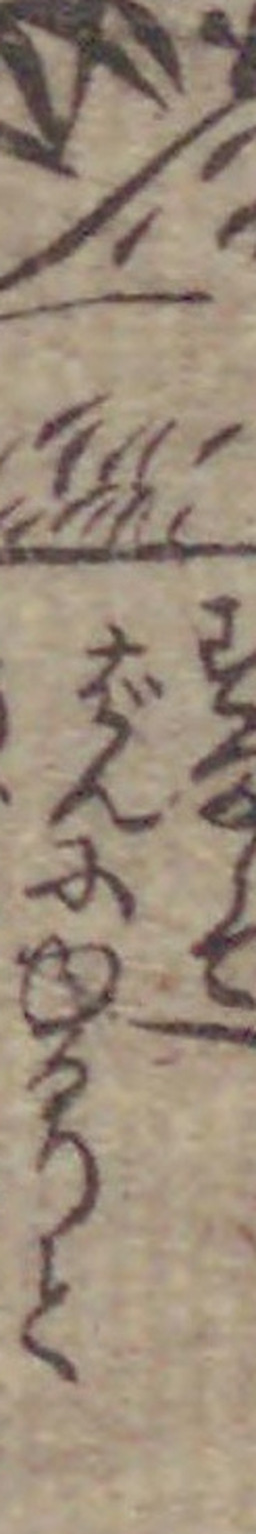ばんにゆるりと
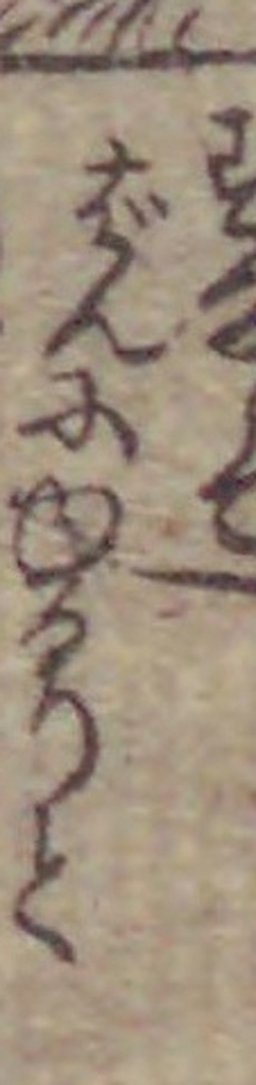ばんにゆるりと
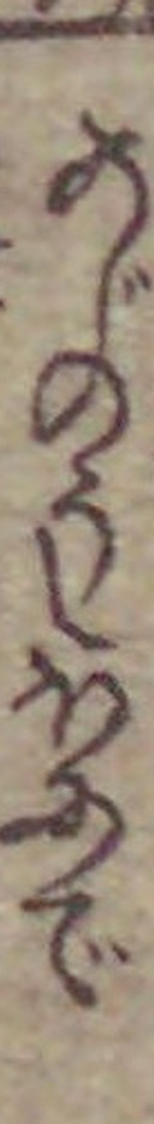あじのうしほにで
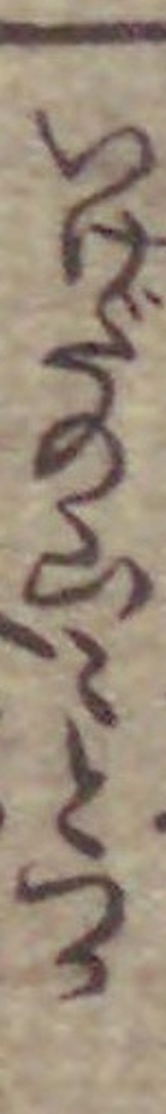いけだの山〃とつか
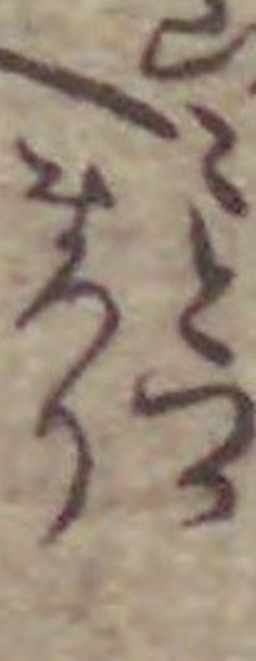まつり
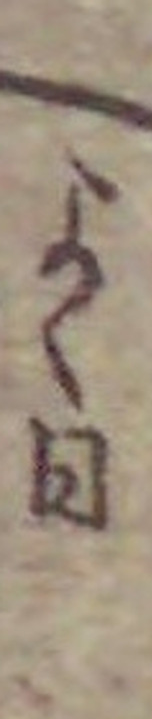よく日
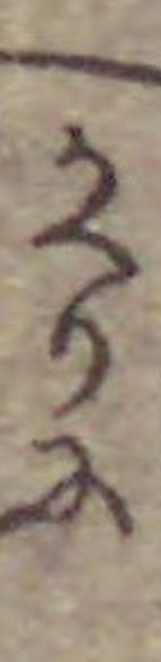かへりに
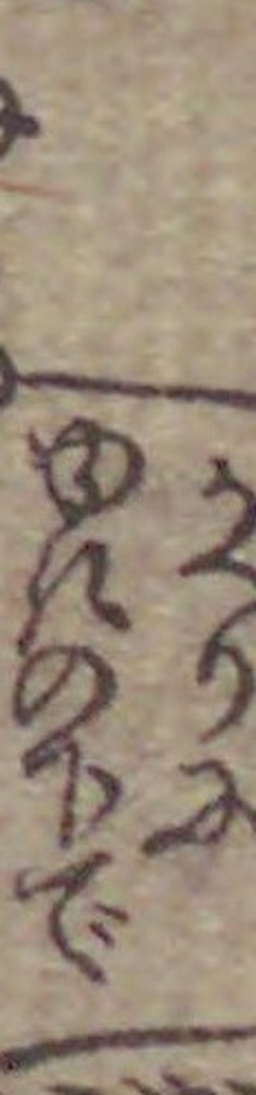ゆきの下で
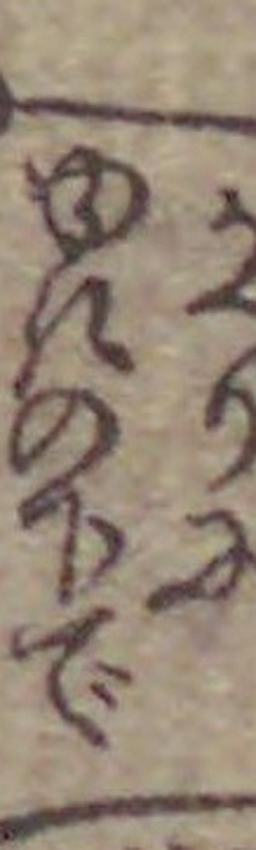ゆきの下で
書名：止而道致虚録 3巻
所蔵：国立国会図書館 National Diet Library, JAPAN
